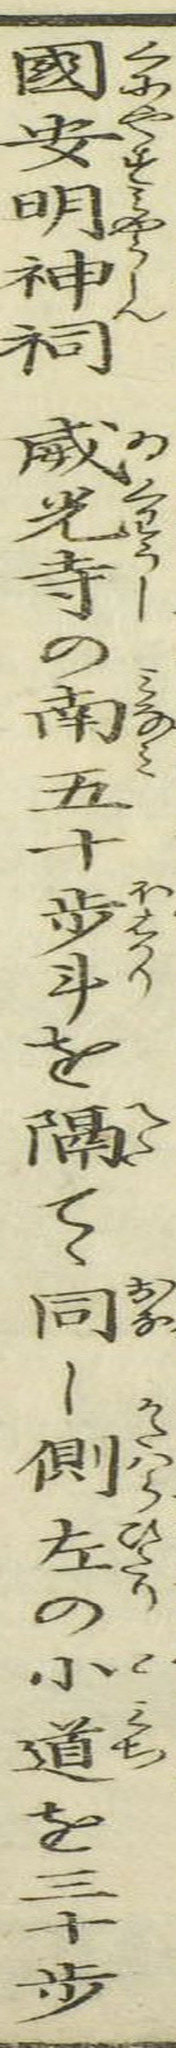国安明神祠威光寺の南五十歩斗を隔てゝ同し側左の小道を三十歩
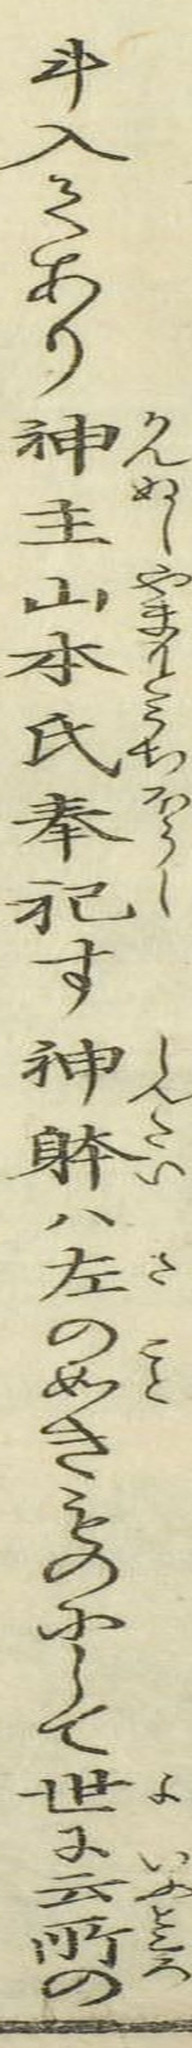斗入てあり神主山本氏奉祀す神躰は左の如きものにして世に云所の
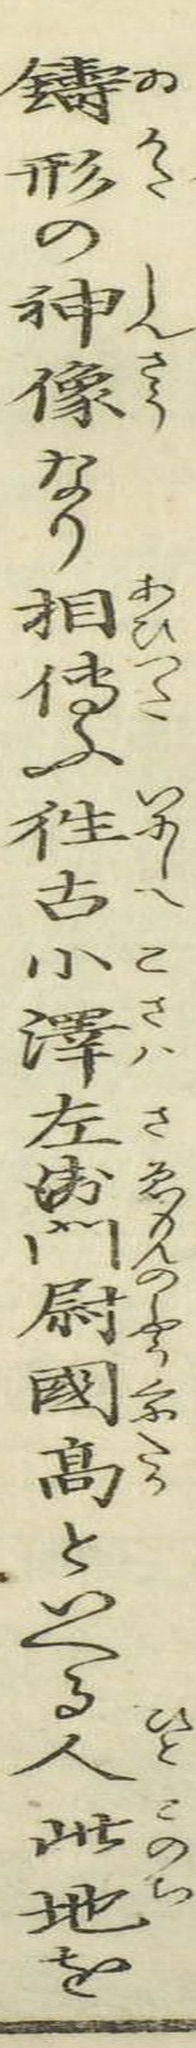鋳形の神像なり相伝ふ往古小沢左衛門尉国高といへる人此地を
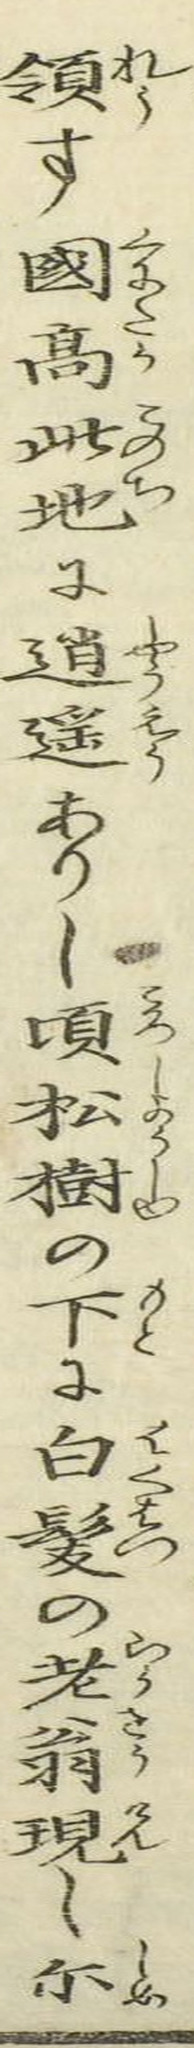領す国高此地に逍遥ありし頃松樹の下に白髪の老翁現し尓
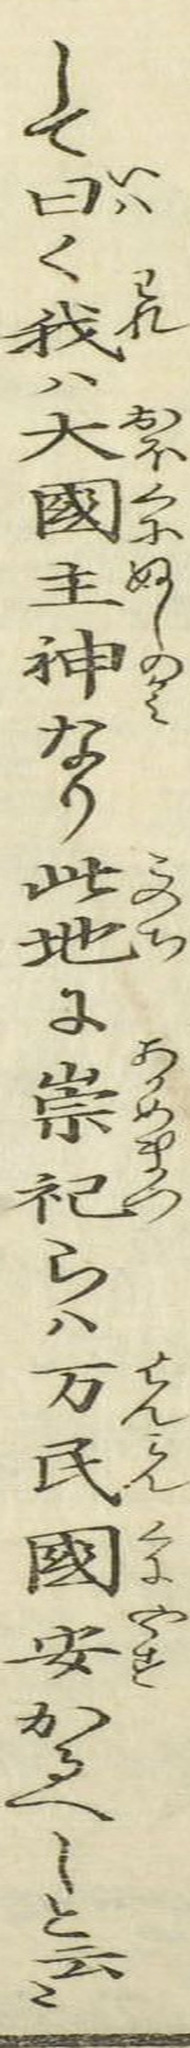して曰く我は大国主神なり此地に崇祀らは万民国安かるへしと云々
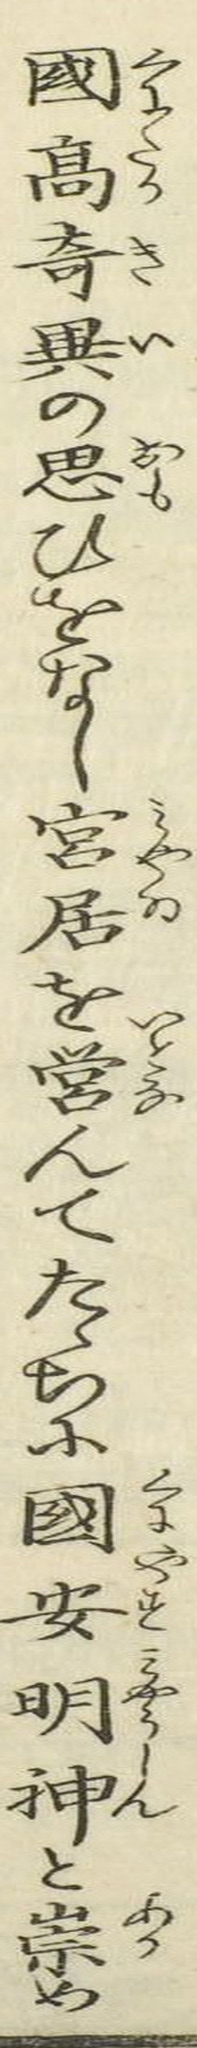国高奇異の思ひをなし宮居を営んてたゝちに国安明神と崇め
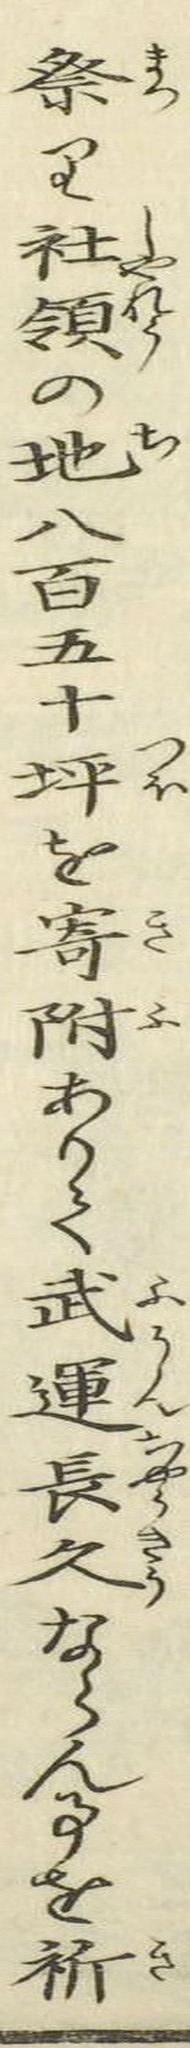祭り社領の地八百五十坪を寄附ありて武運長久ならん事を祈
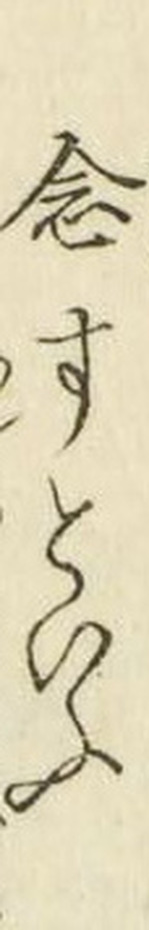念すといふ
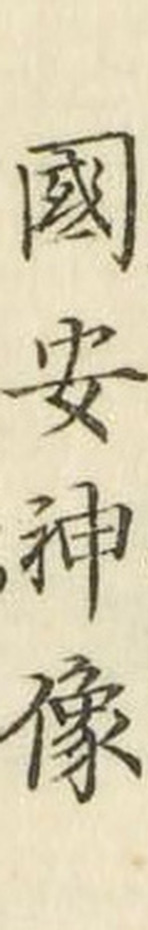国安神像
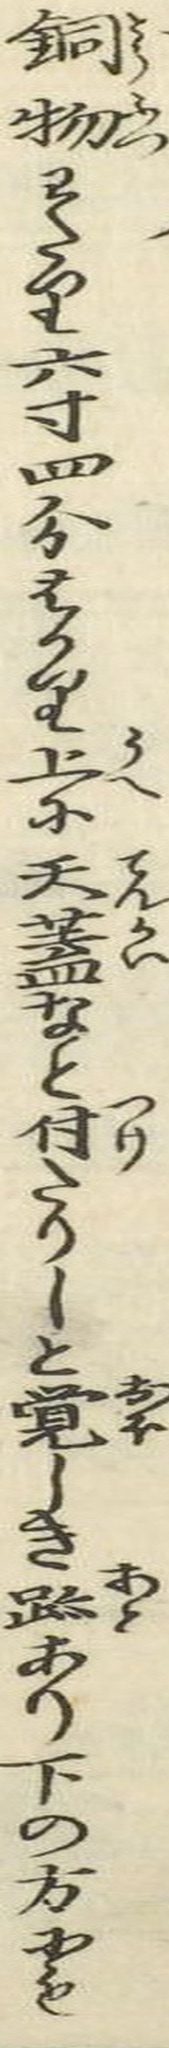銅物わたり六寸四分はかり上に天蓋なと付たりしと覚しき跡あり下の方にも
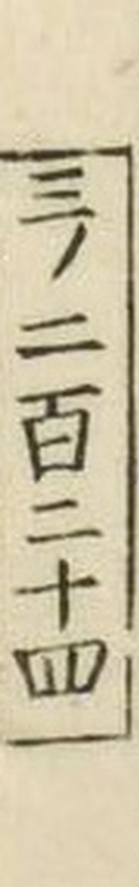三ノ二百二十四
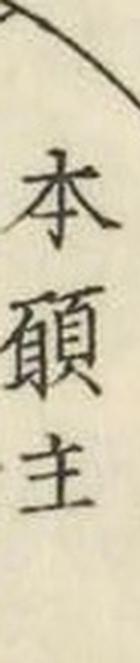本願主
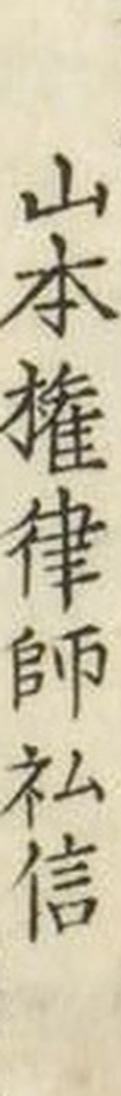山本権律師信
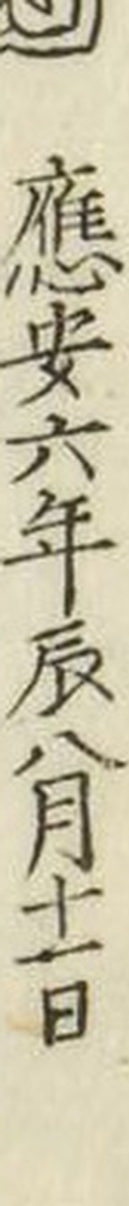応安六年辰八月十一日
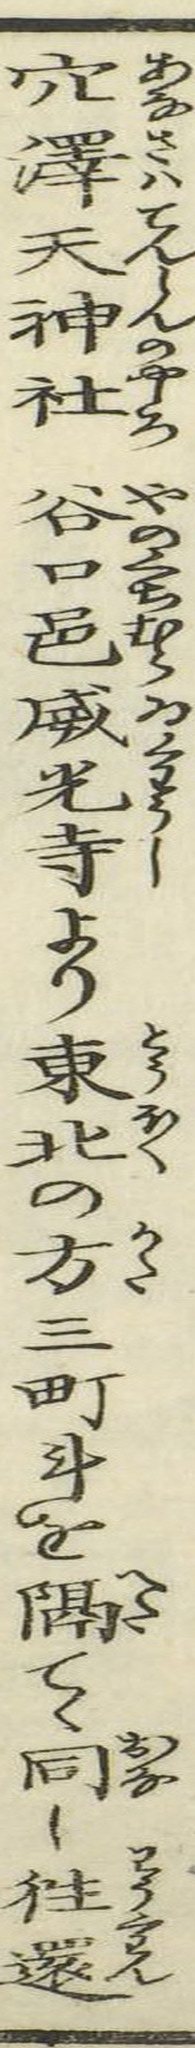穴沢天神社谷口邑威光寺より東北の方三町斗を隔てゝ同し往還
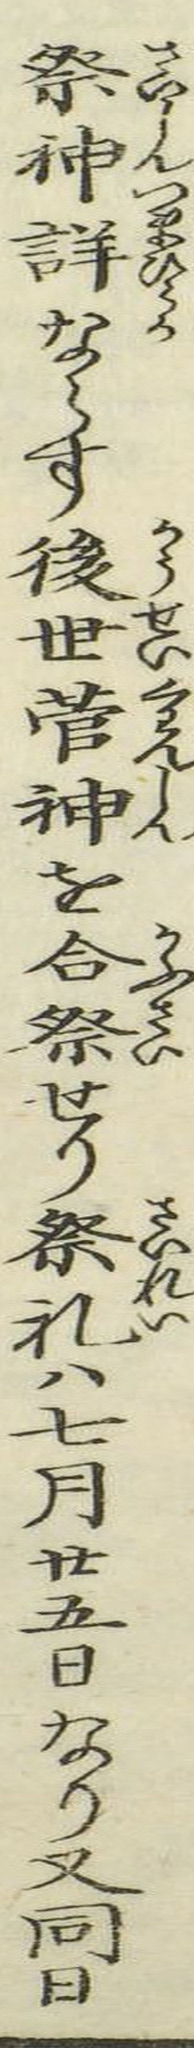祭神詳ならす後世菅神を合祭せり祭礼は七月廿五日なり又同日
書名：江戸名所図会 20巻 巻之10
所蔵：東京学芸大学教育コンテンツアーカイブ
